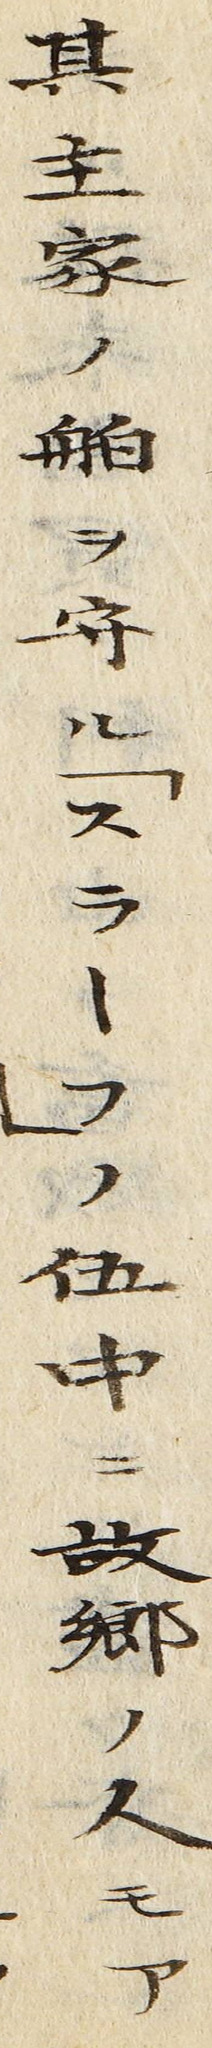其主家ノ舶ヲ守ル「スラーフ」の伍中に故郷ノ人モア
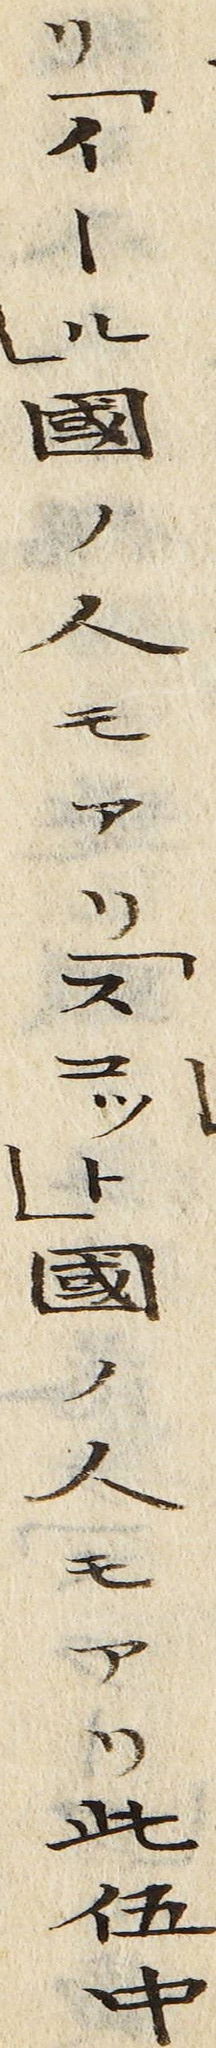リ「イール」国ノ人もあり「スコット」国ノ人モアリ此伍中
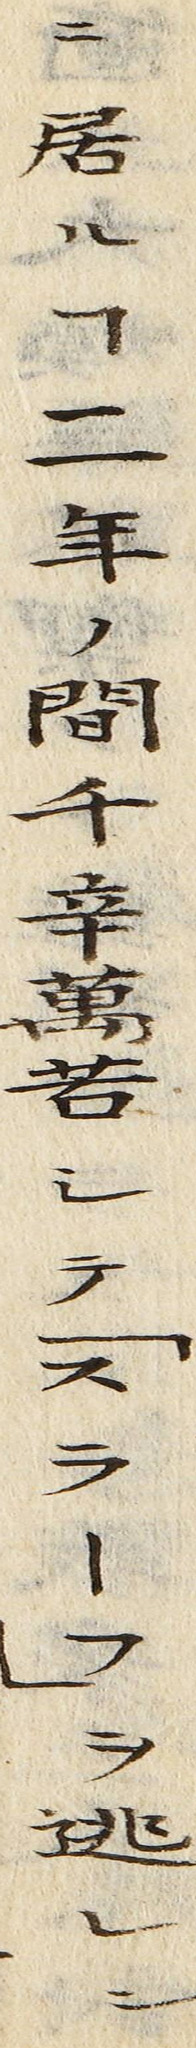ニ居ルコト二年ノ間千辛万苦シテ「スラーフ」ヲ逃レン
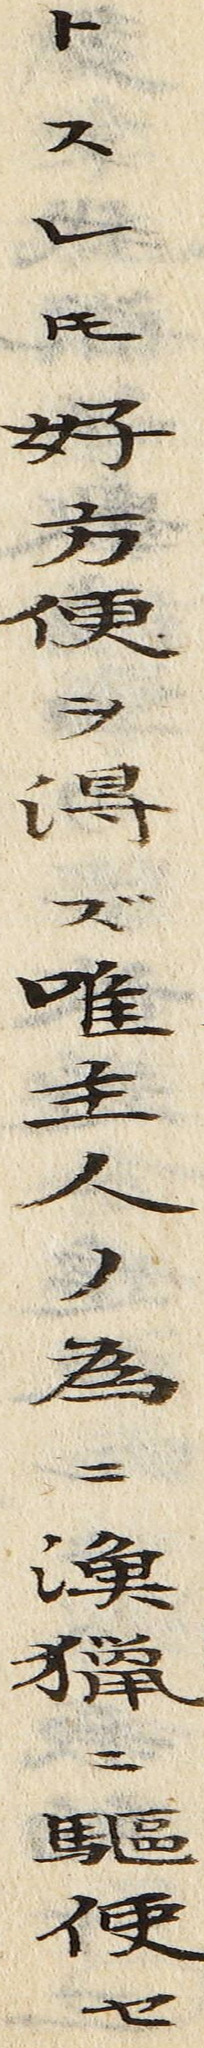トスレトモ好方便ヲ得ズ唯主人ノ為ニ漁猟ニ駆使セ
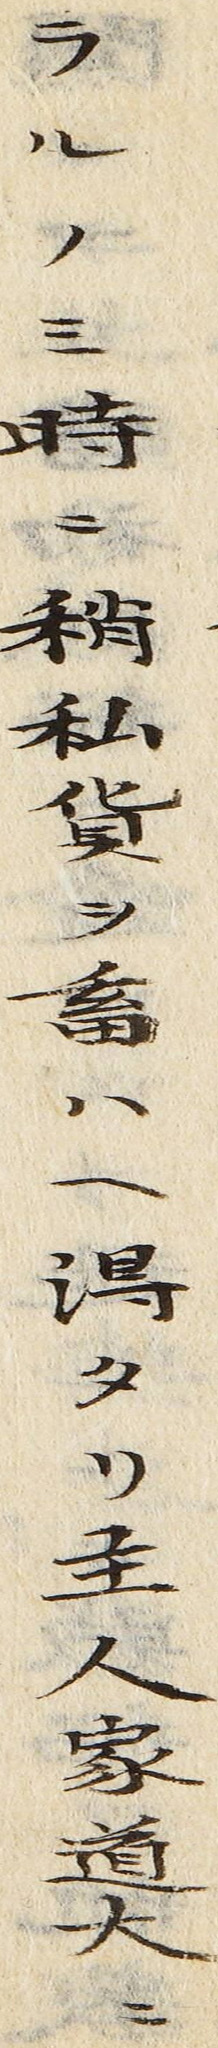ラルノミ時ニ稍私貨ヲ畜ハヘ得タリ主人家道大ニ
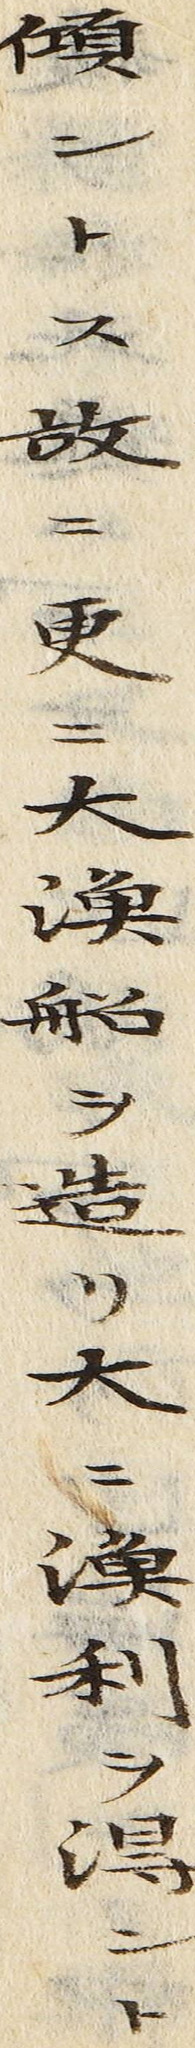傾ントス故ニ更ニ大漁船ヲ造リ大ニ漁利ヲ得ント
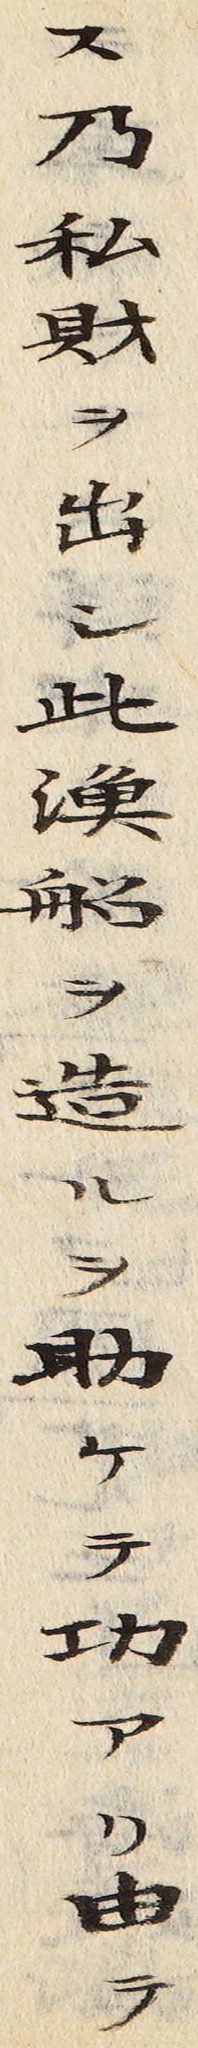ス乃私財ヲ出シ此漁船ヲ造ルヲ助ケテ功アリ由テ
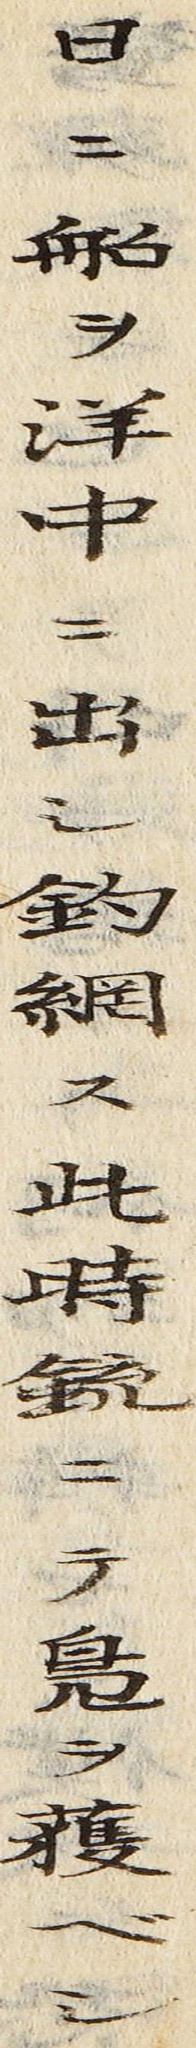日ニ船ヲ洋中ニ出シ釣網ス此時銃ニテ鳬ヲ獲ベシ
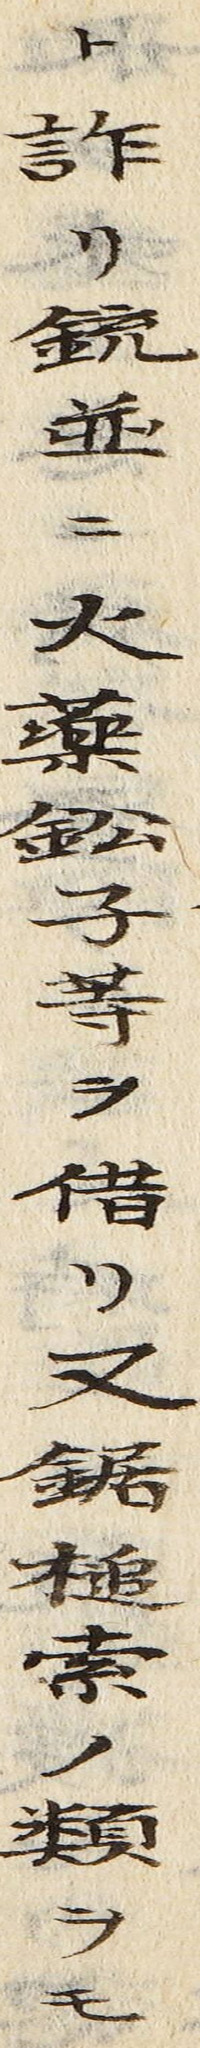ト詐リ銃並ニ火薬鈆子等ヲ借リ又鋸槌索ノ類ヲモ
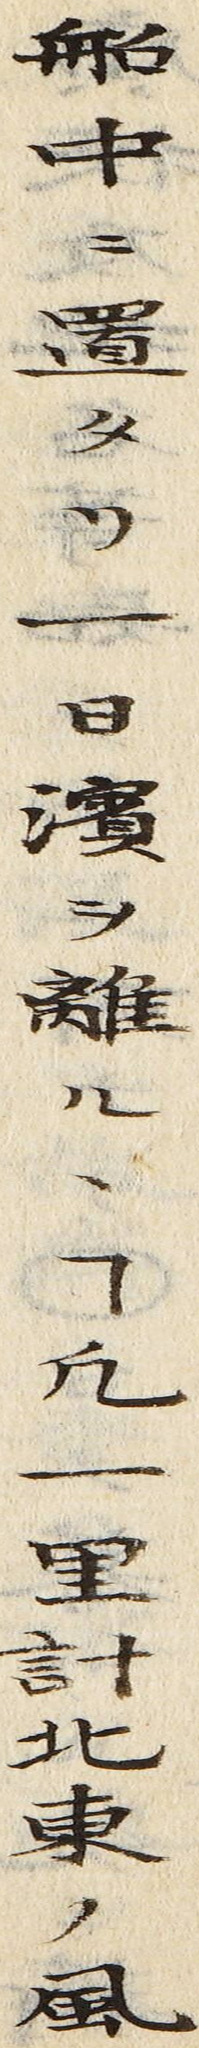船中ニ置タリ一日浜ヲ離ルヽコト凡一里計北東ノ風
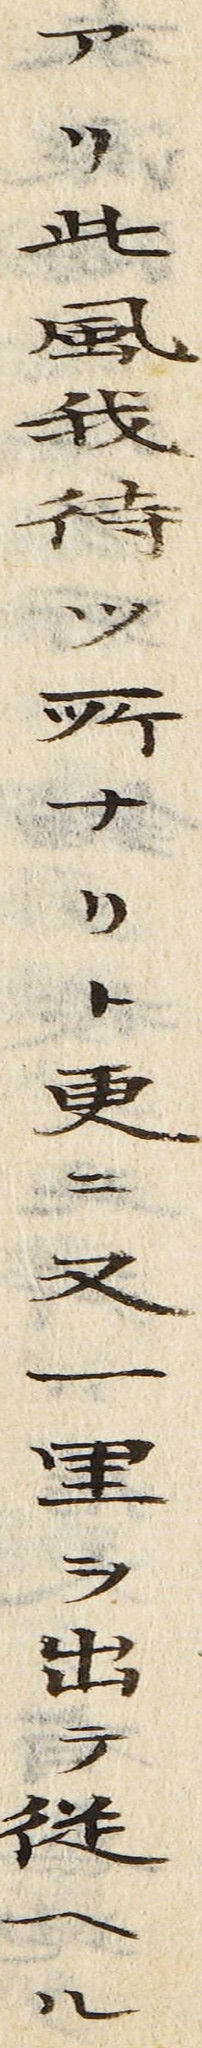アリ此風我待ツ所ナリト更ニ又一里ヲ出テ従ヘル
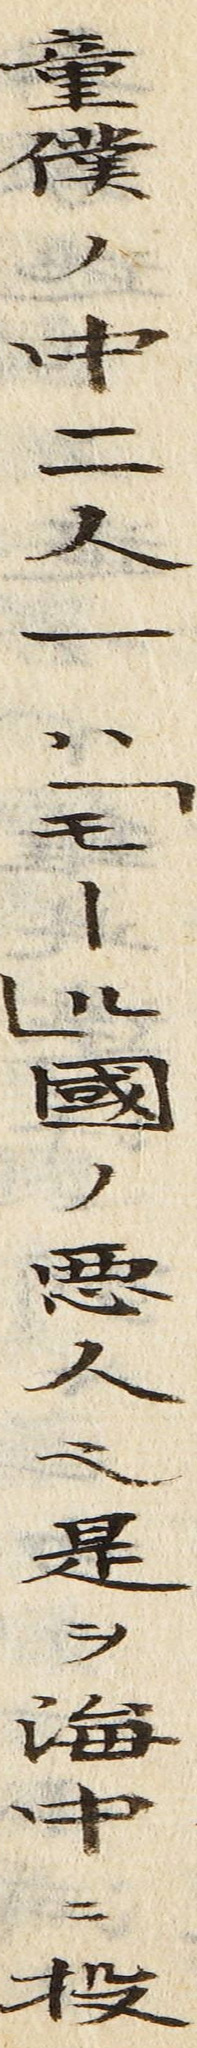童僕ノ中二人一ハ「モール」国ノ悪人也是ヲ海中ニ投
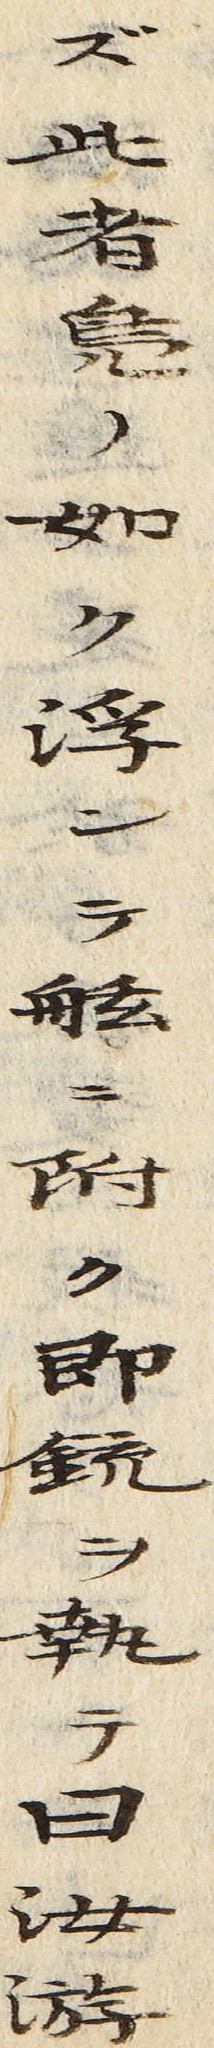ズ此者鳬ノ如ク浮ンテ舷ニ附ク即銃ヲ執テ曰汝游
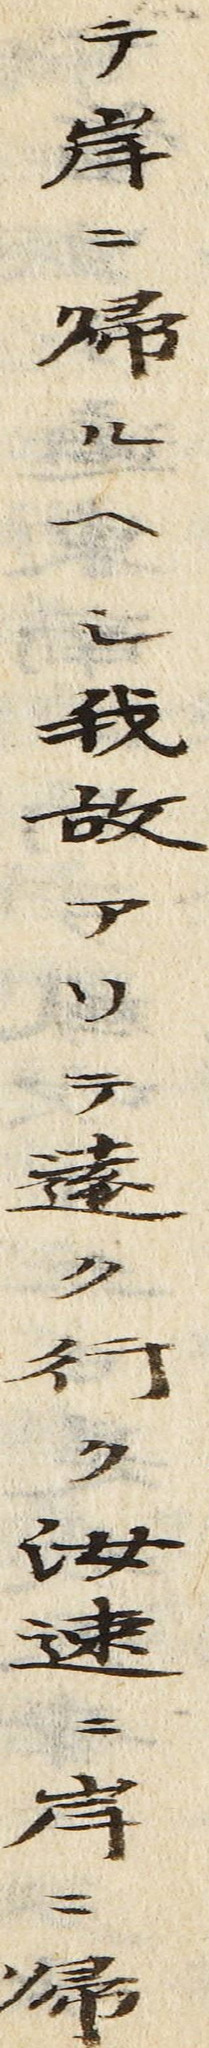テ岸ニ帰ルヘシ我故アリテ遠ク行ク汝速ニ岸ニ帰
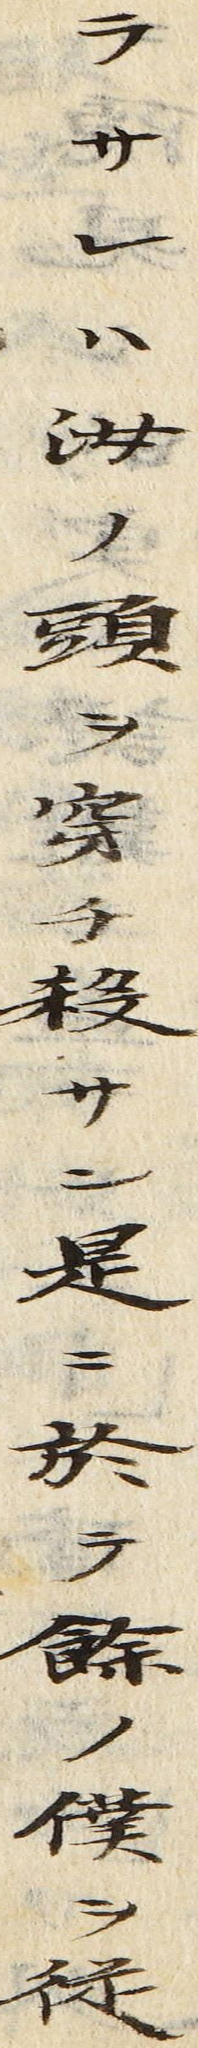ラサレハ汝ノ頭ヲ穿チ殺サン是ニ於テ余ノ僕ヲ従
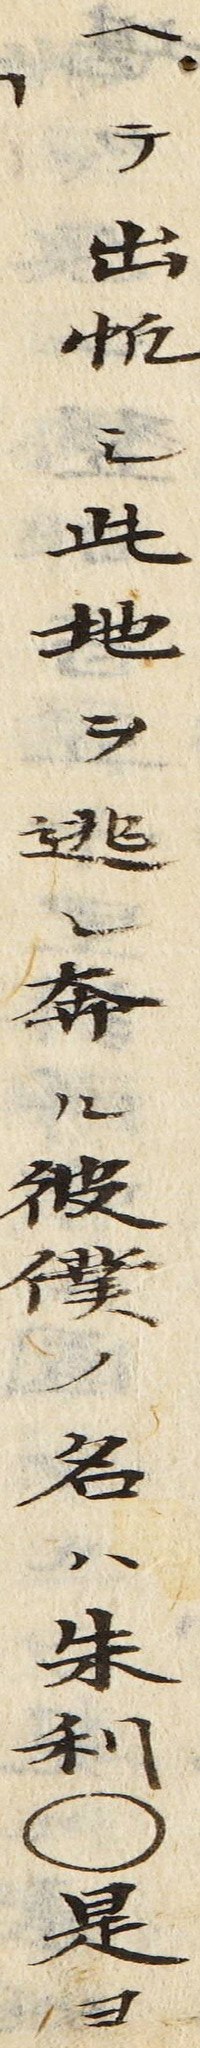ヘテ出帆シ此地ヲ逃レ奔ル彼僕ノ名ハ朱利○是ヨ
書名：漂流紀事
